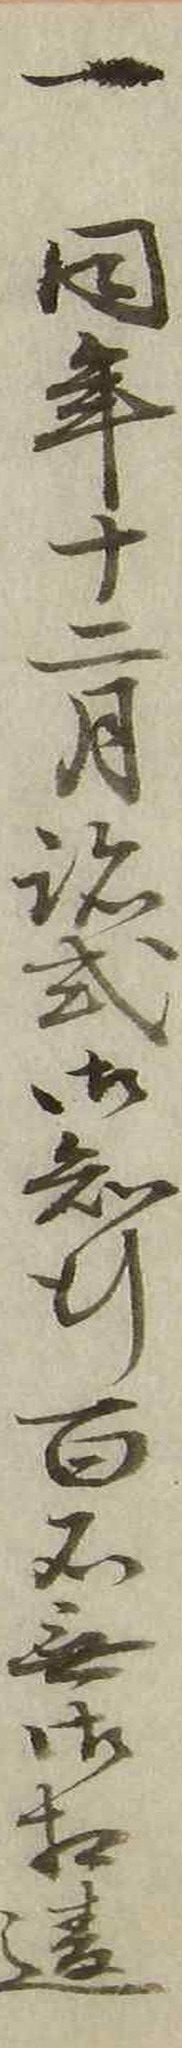一同年十二月跡式御知行百石無御相違
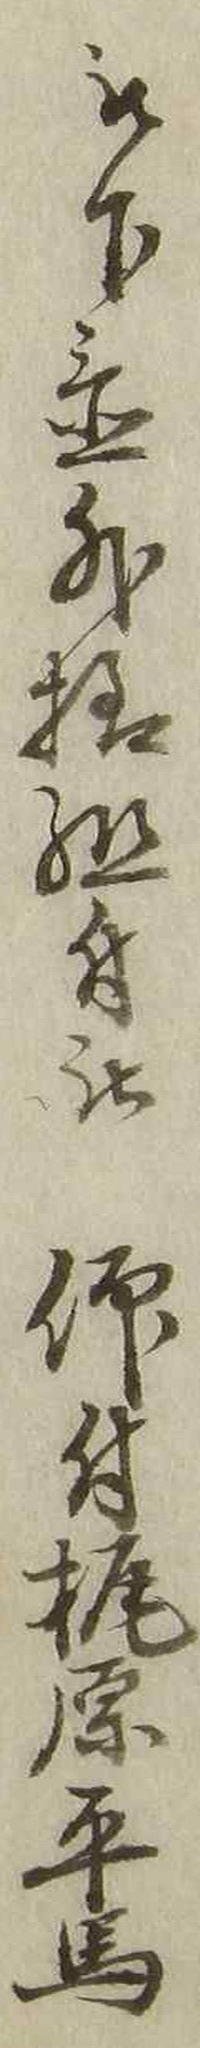被下置外様組付被仰付梶原平馬
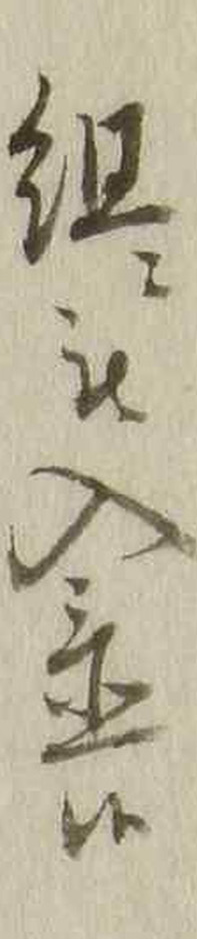組ニ被入置候
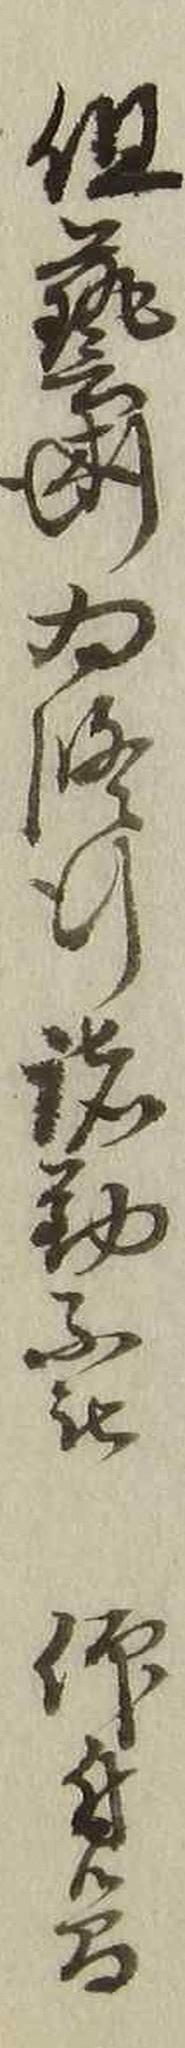但芸術為修行諸勤不被仰付候間
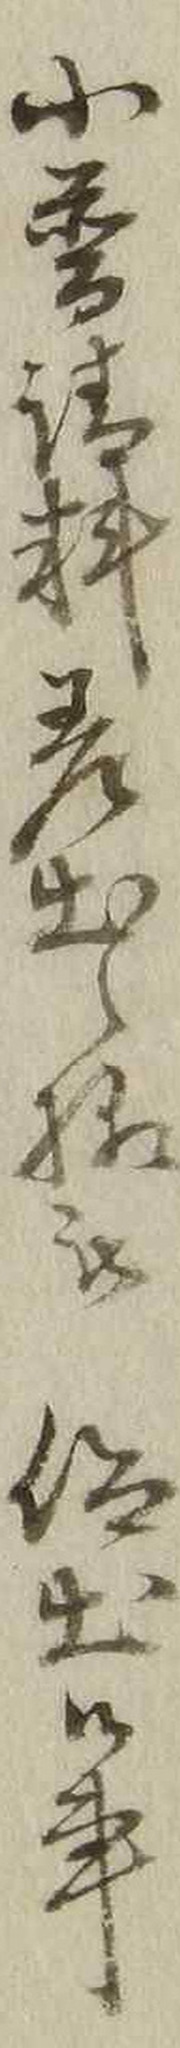小普請料差出候様被仰出候事
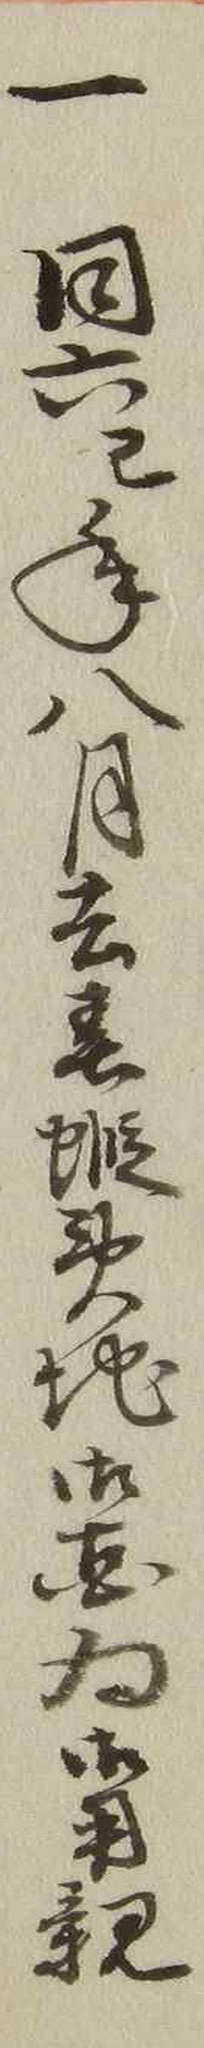一同六巳年八月去春蝦夷地御固為御用親
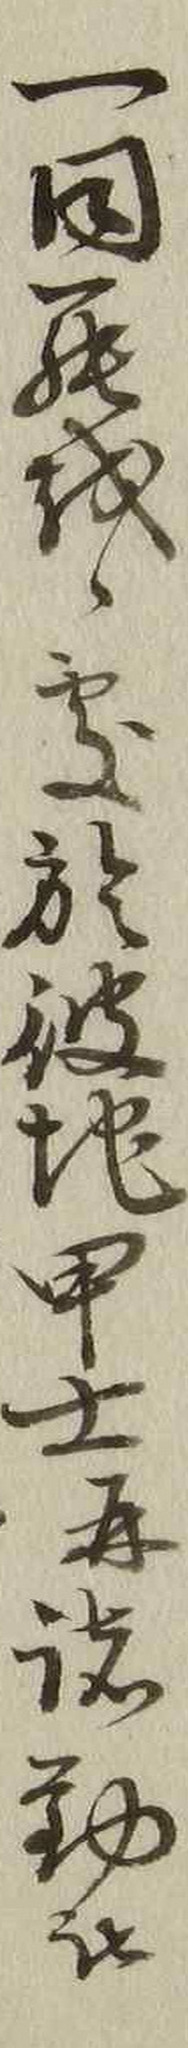一同罷越候処於彼地甲士并諸勤被
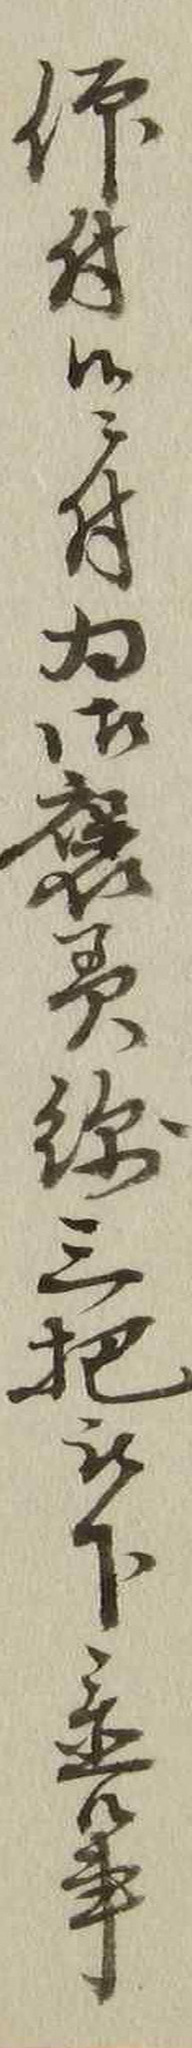仰付候ニ付為御褒美綿三把被下置候事
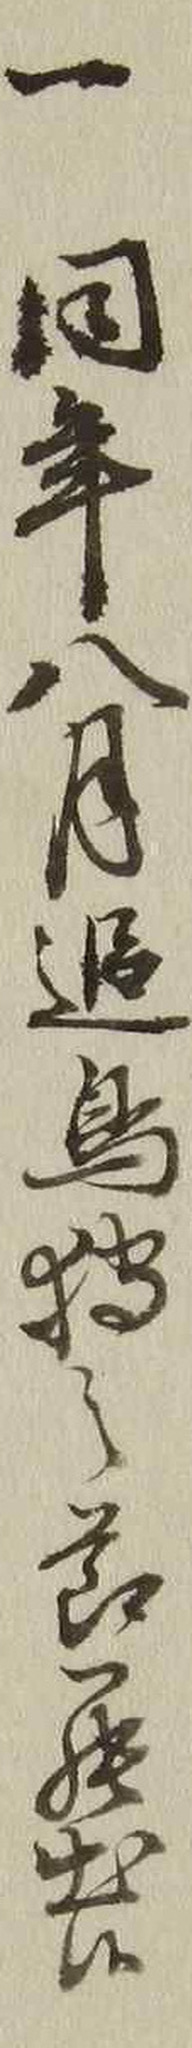一同年八月追鳥狩之節罷出候
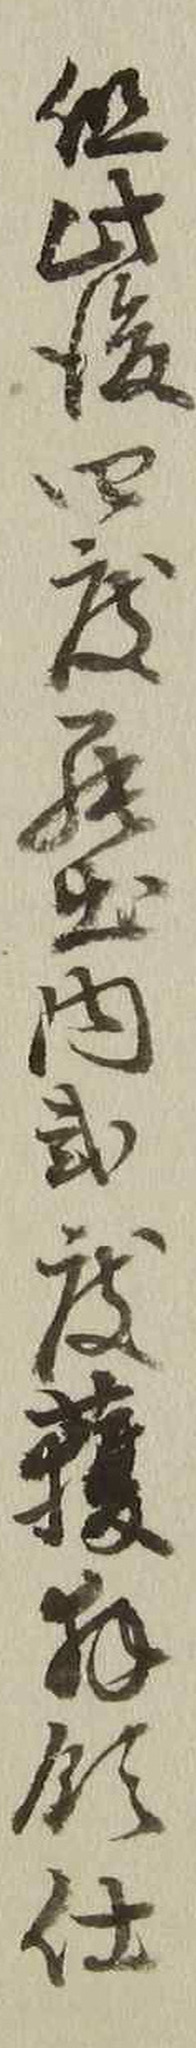但此後四度罷出内弐度獲拝領仕
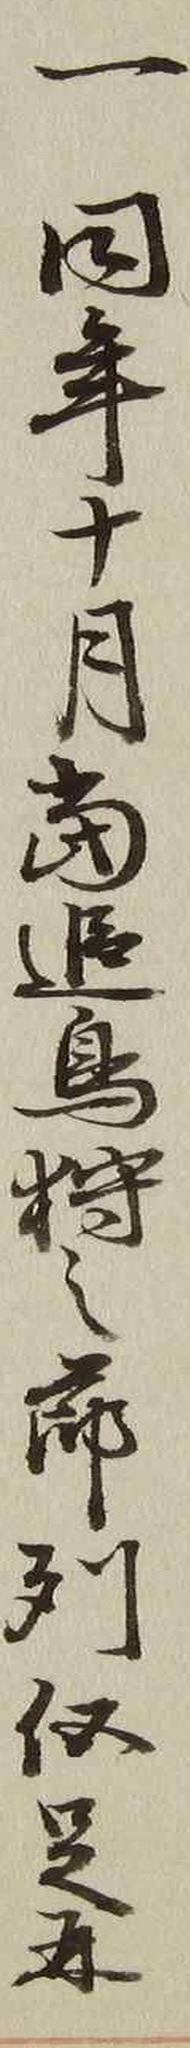一同年十月当追鳥狩之節列伍足并
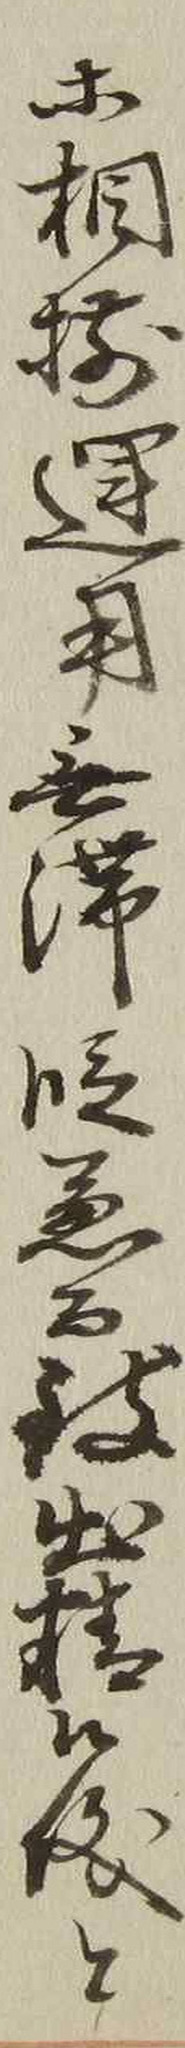等相揃運用無滞段兼而致出精候儀と
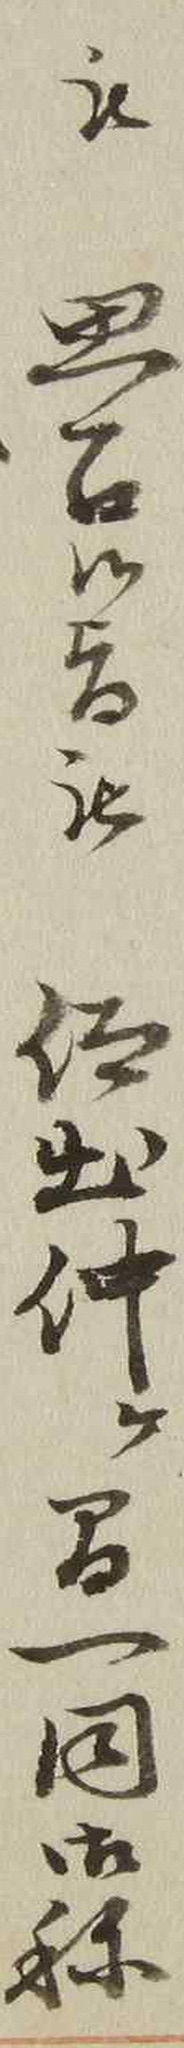被思召候旨被仰出仲ケ間一同御称
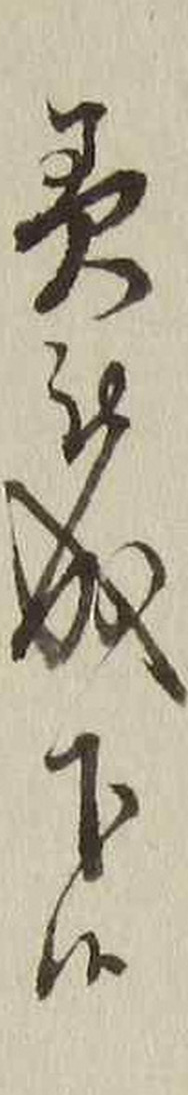美被成下候
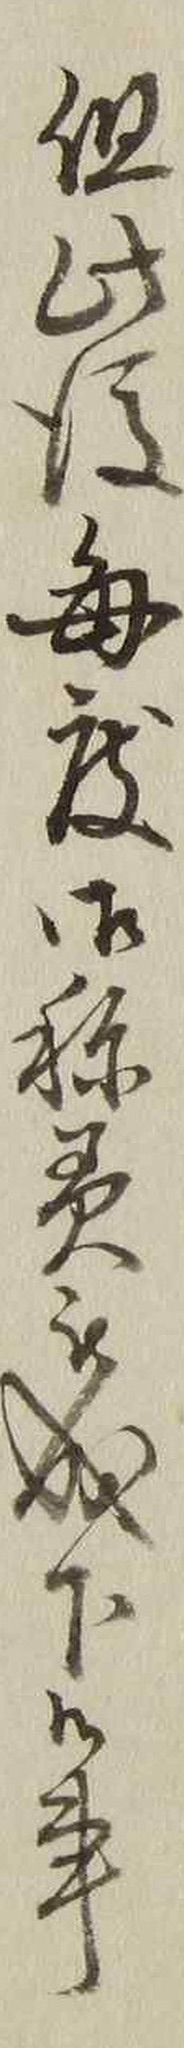但此後毎度御称美被成下候事
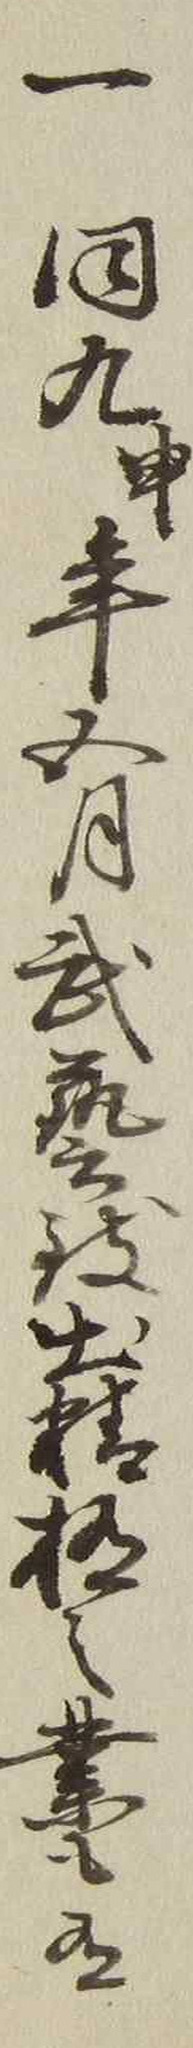一同九申年五月武芸致出精極之業も有
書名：諸士系譜　巻之27　い之部27
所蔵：会津若松市立会津図書館
